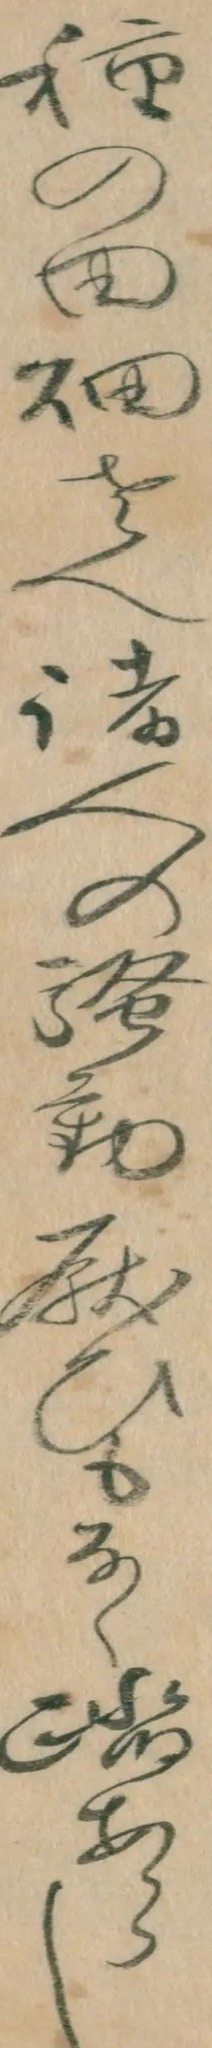種の田畑さへ諸人の騒動厭ひもなく踏あらし
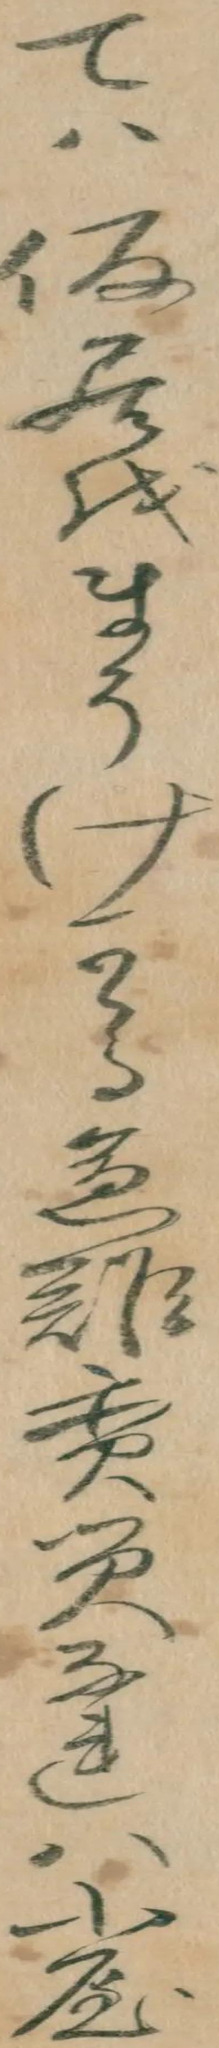ては仮居をまうけかゝる急難変災なれは小屋
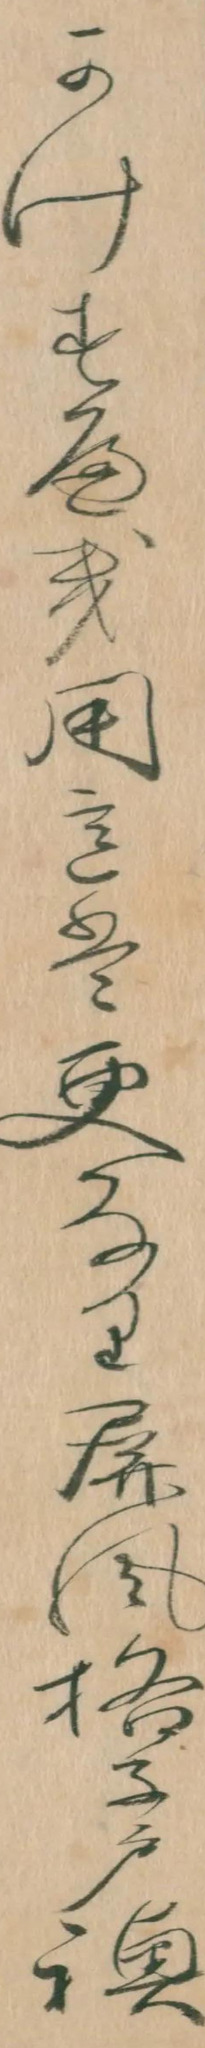かけすへき用意は更なり屏風格子戸襖
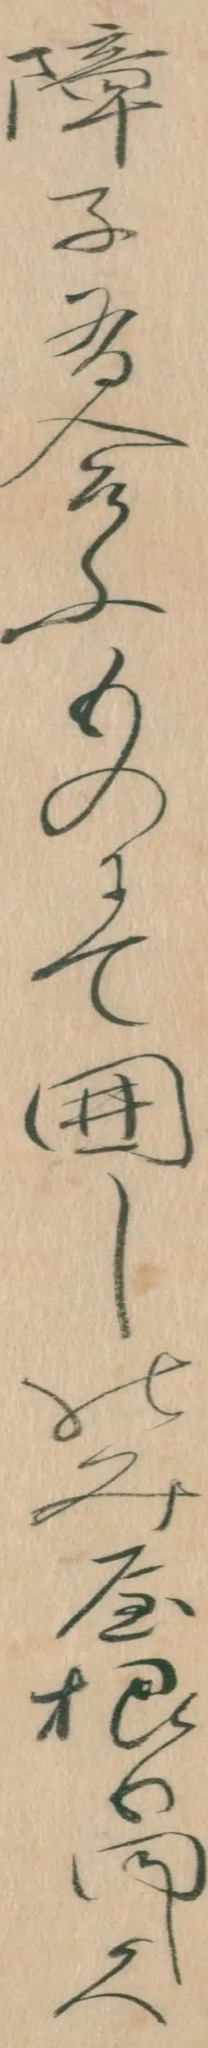障子有合ふものにて囲しのみ屋根も同しく
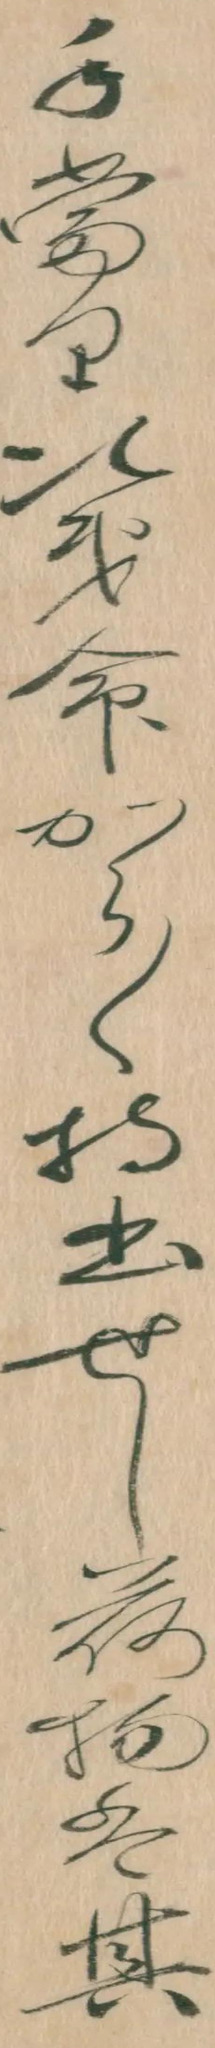手当り次第命から〳〵持出せし荷物は其
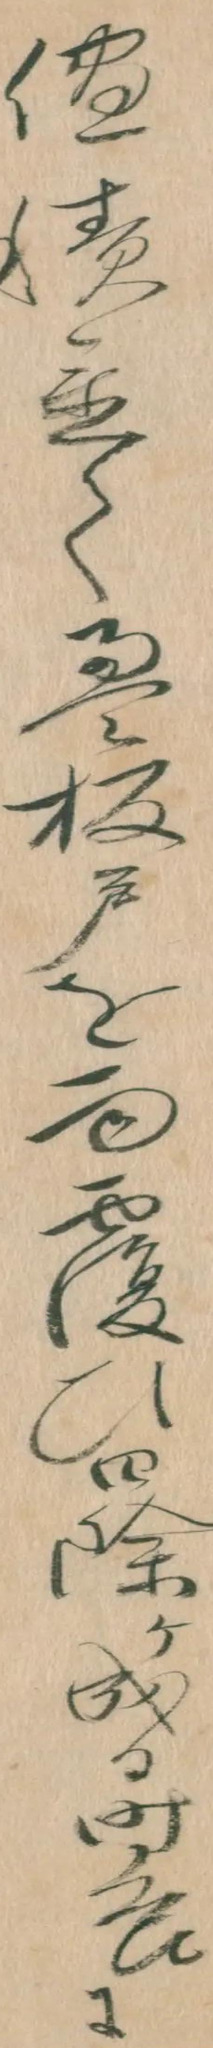侭積置て畳板戸を雨覆ひ日除ケ成る時節に
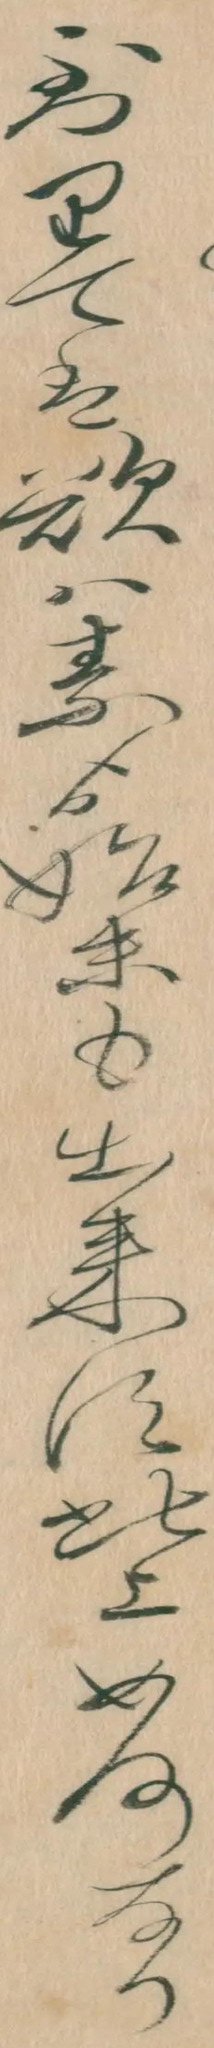到りては欲は素ゟ始末も出来す此上如何なり
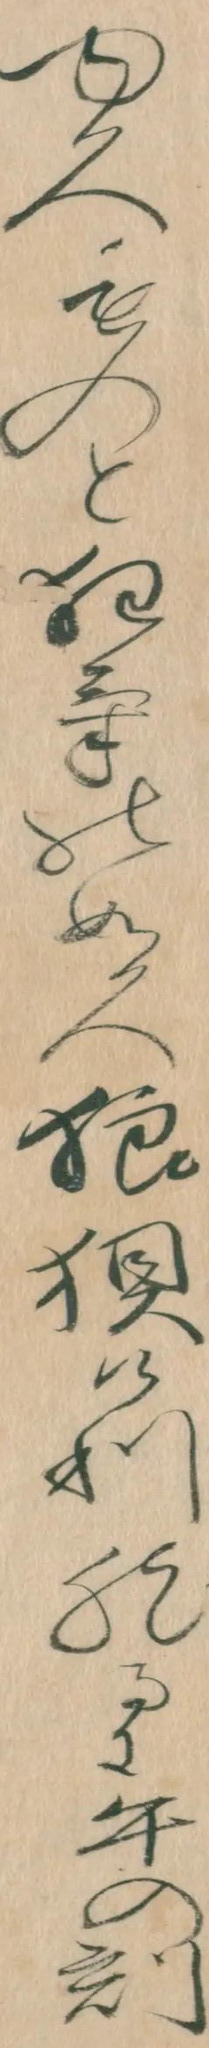ゆくものと狂気の如く狼狽けり然るに午の刻
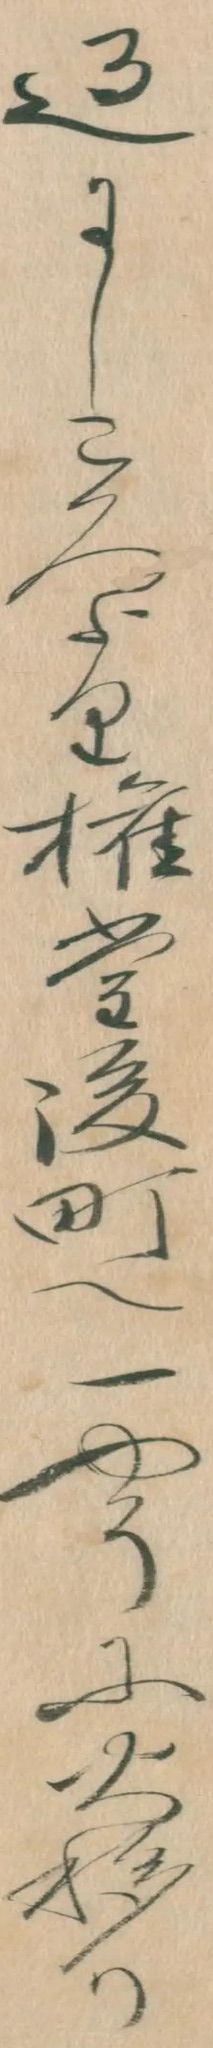過にこしろより権堂後町へ一やうに火移り
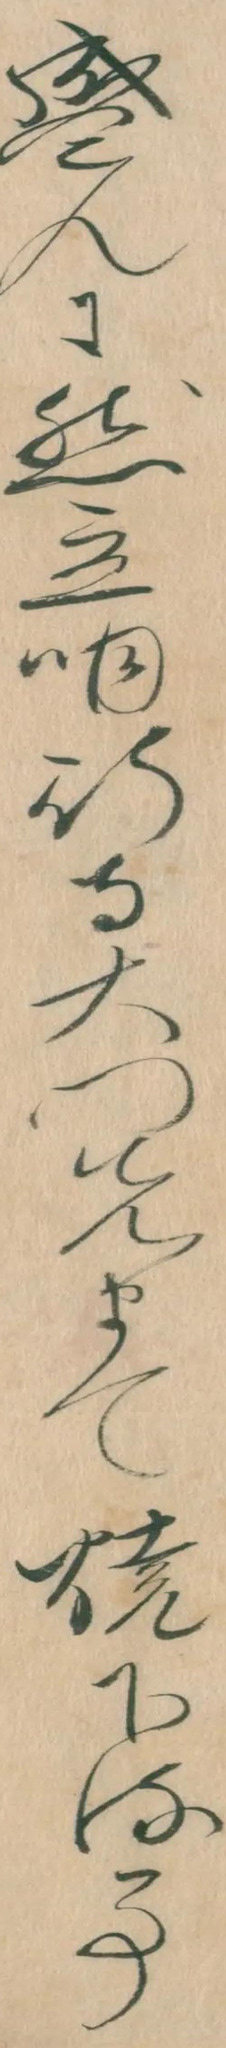盛んに然立明行寺大門先まて焼下る事
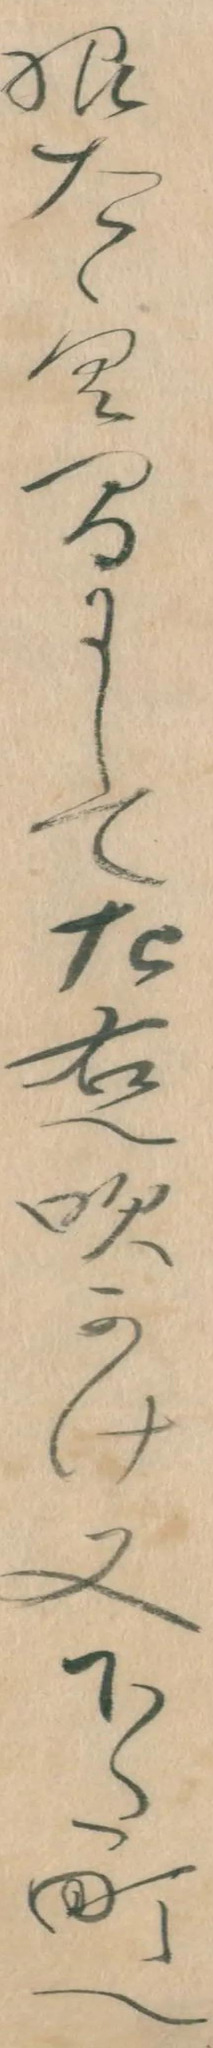眼たゝく間にして左右へ吹かけ又下た町へ
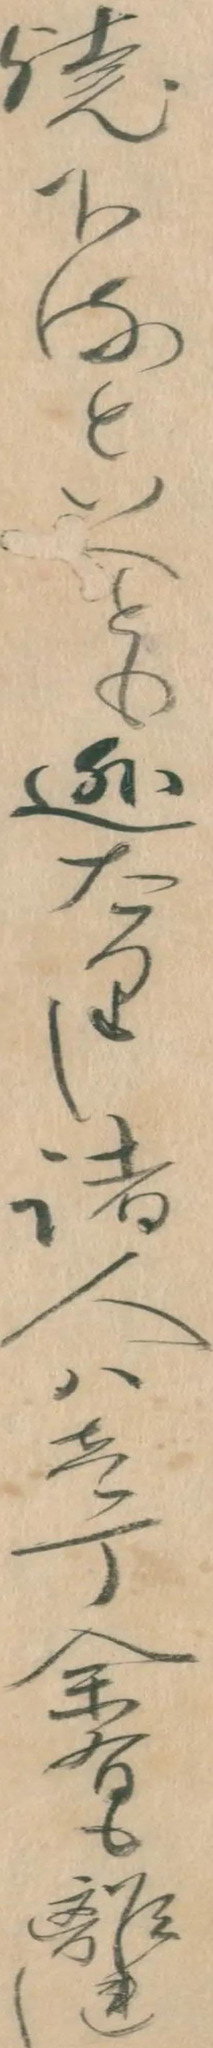焼下るといへとも逃たりし諸人は壱丁余有も離れし

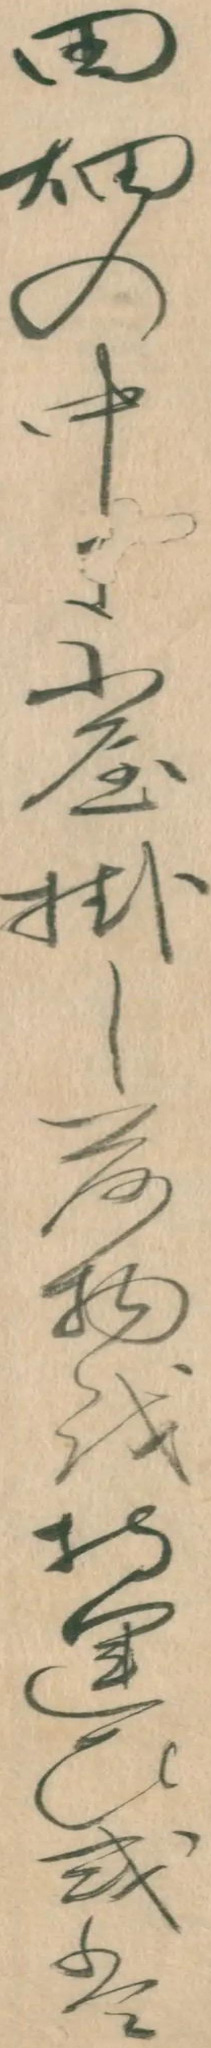田畑の中に小屋掛し荷物を持運ひ或は
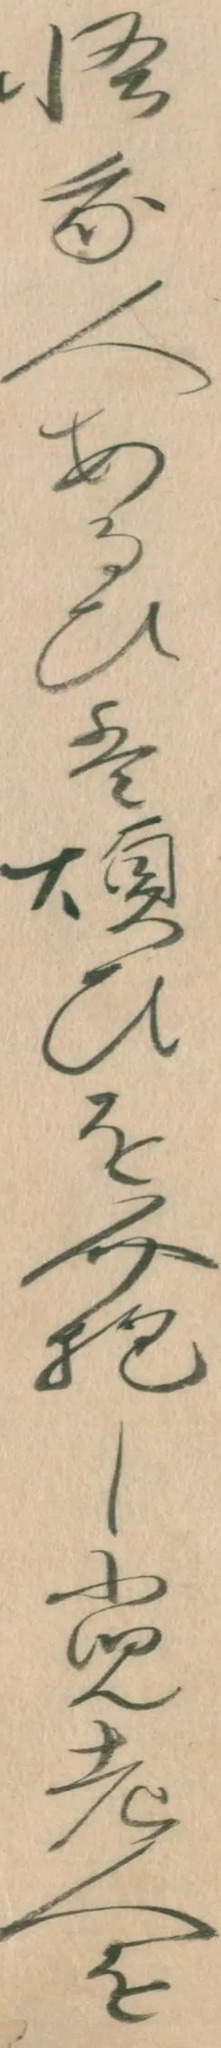怪我人あるひは煩ひを介抱し小児老人を
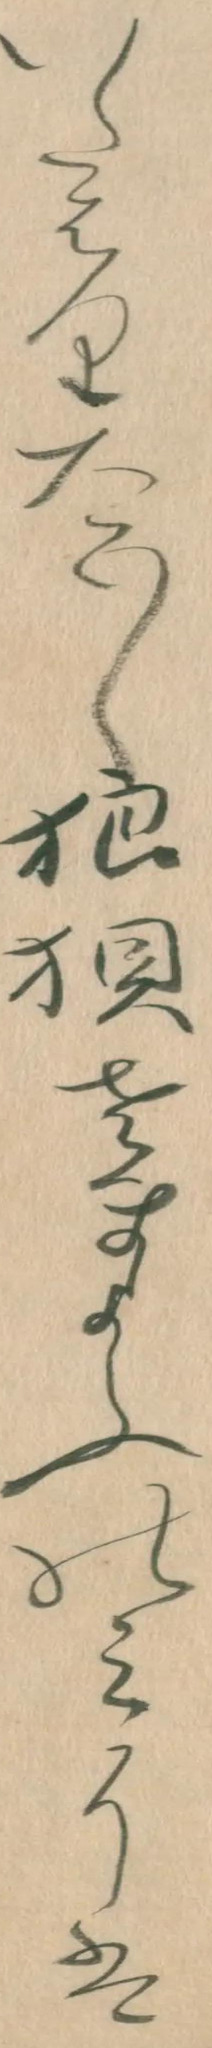いたはりたゝ〳〵狼狽さまよふのみには
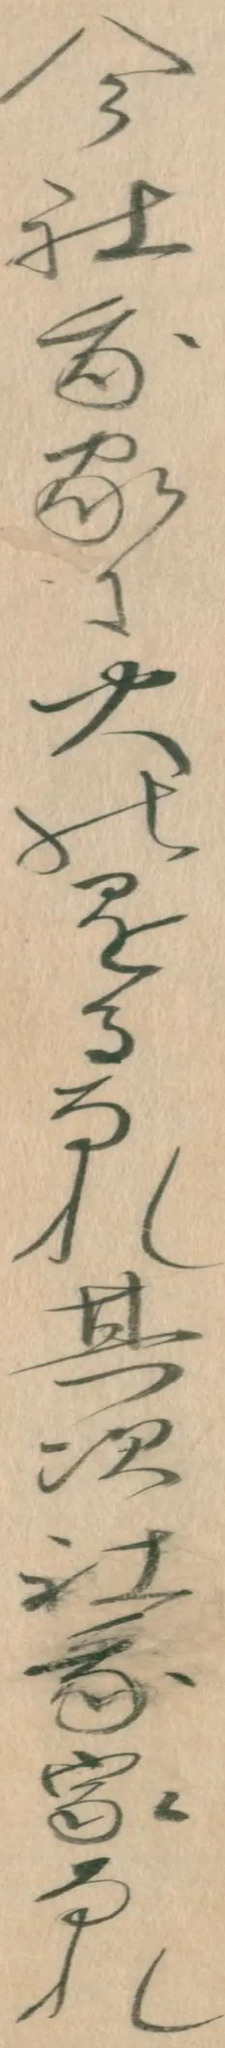今社我家に火の懸るなれ其次社我家なれ
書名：俗語之種. [4]
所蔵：国立国会図書館 National Diet Library, JAPAN
